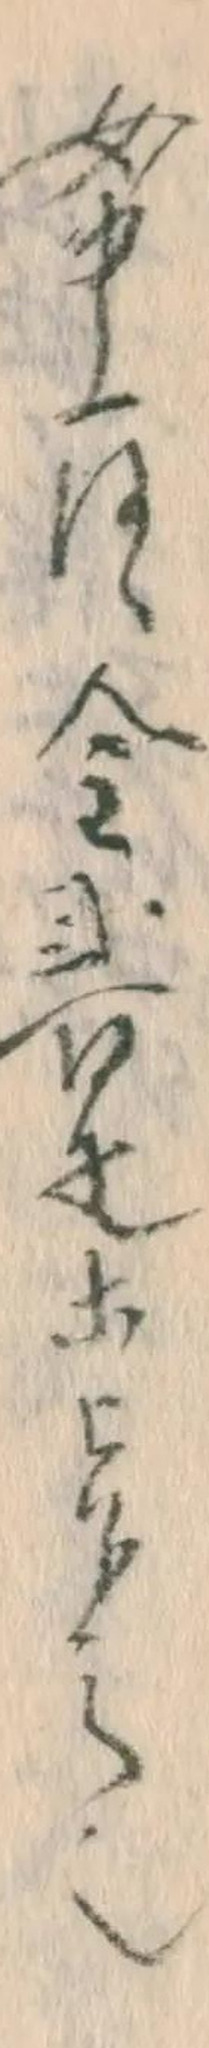女中一同へ金弐百疋等被下之也
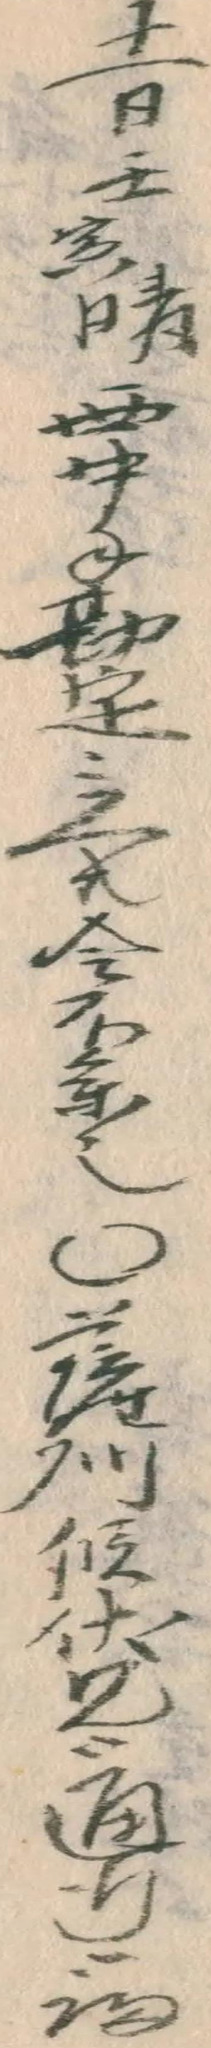十一日壬寅晴西中手勘定三人共令不参也○薩州候伏見御通行御帰
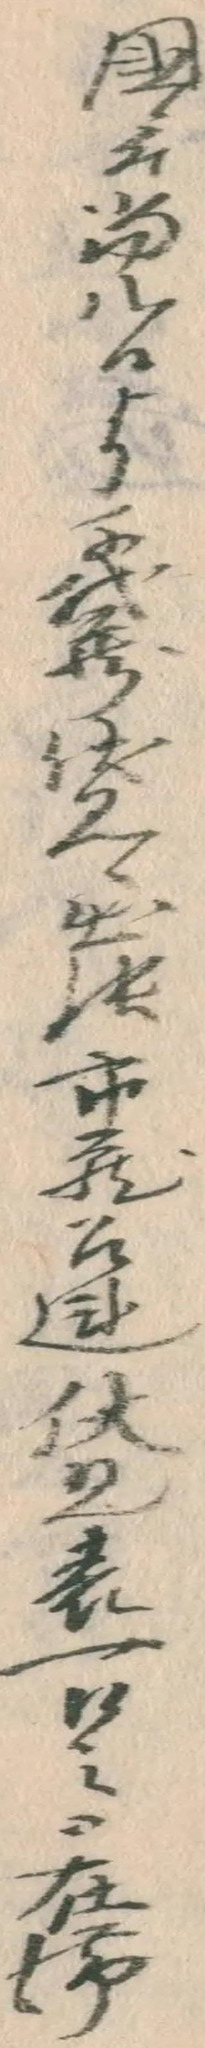國二付當八日ゟ千代蔵伏見へ出張市蔵召連伏見表一日之御在滞
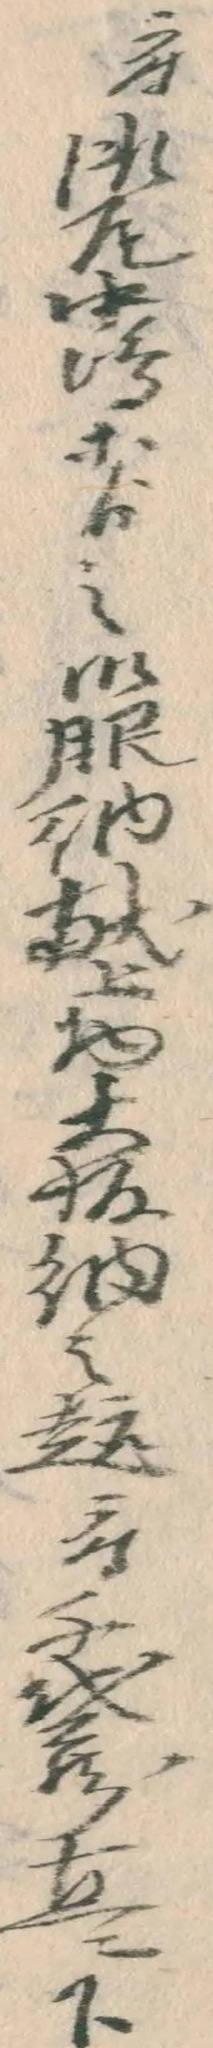ニ付瀬尾中嶋等ゟ之御眼納献上物大坂納之趣ニ付千代蔵直ニ下
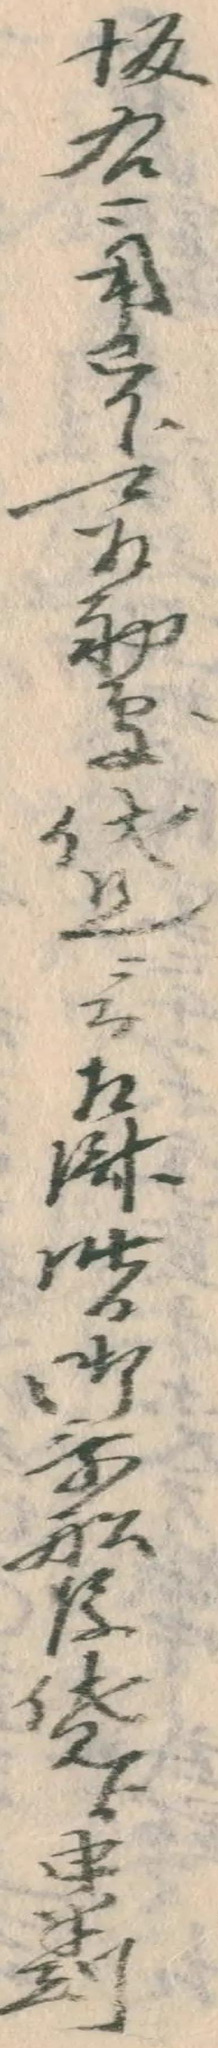坂右御用已下可相勤處伏見ニ而相済昨日御乗舩後伏見ゟ申半割
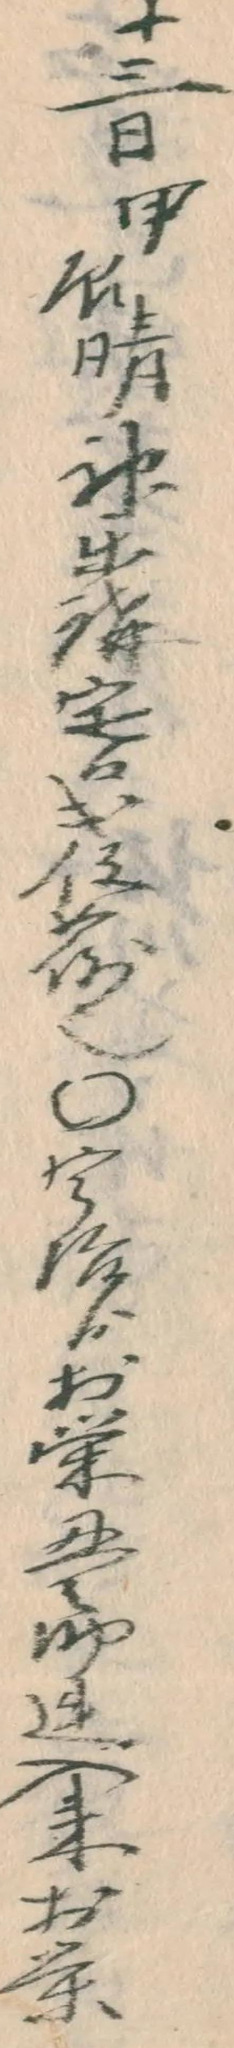十三日甲辰晴神楽講定日出役如例也〇宇治ゟお栄丑之助連入来お栄
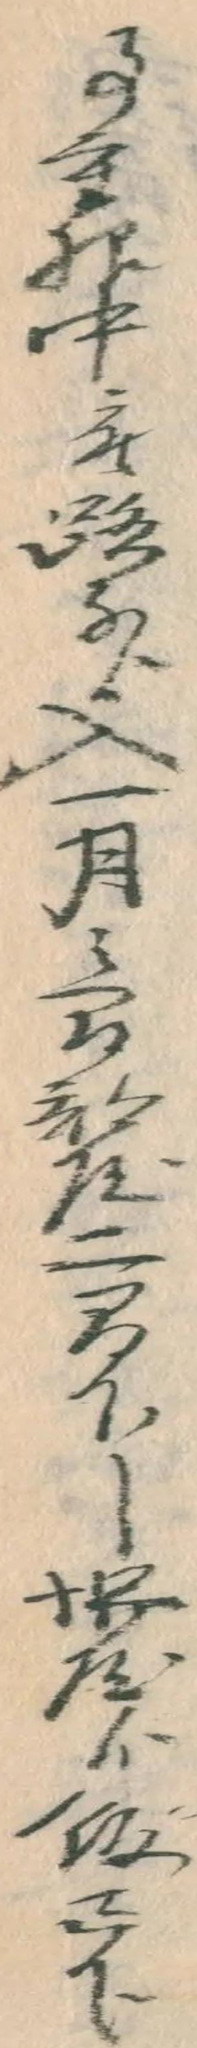事重服中ニ付路子ゟ入一月之間部屋二間下し堺屋ゟ飯已下

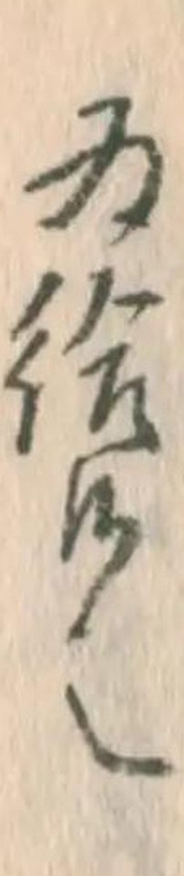為給候也
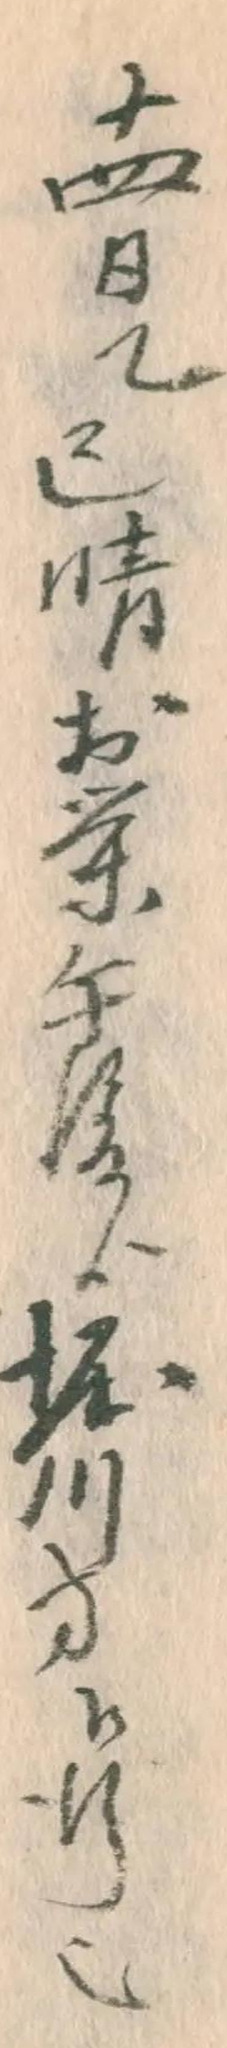十四日乙巳晴お栄午後ゟ堀川方え行也
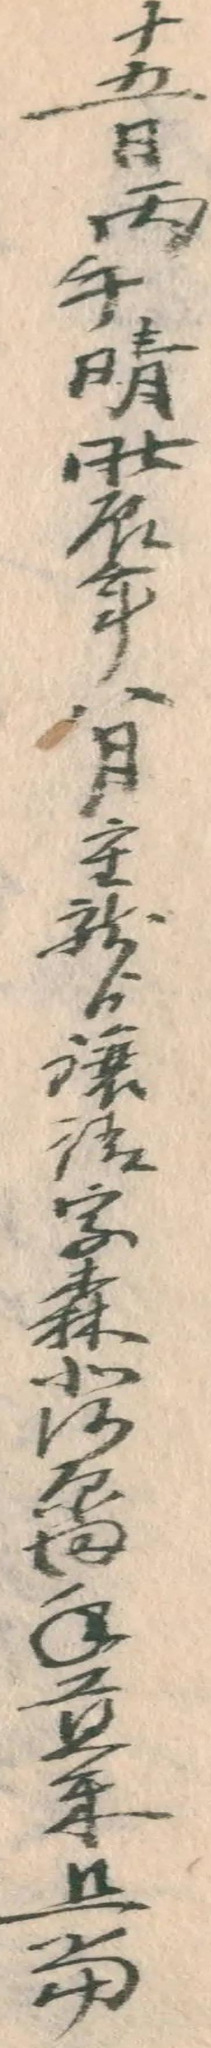十五日丙午晴昨辰年八月重龍ゟ譲請字森北河原田年貢来且當
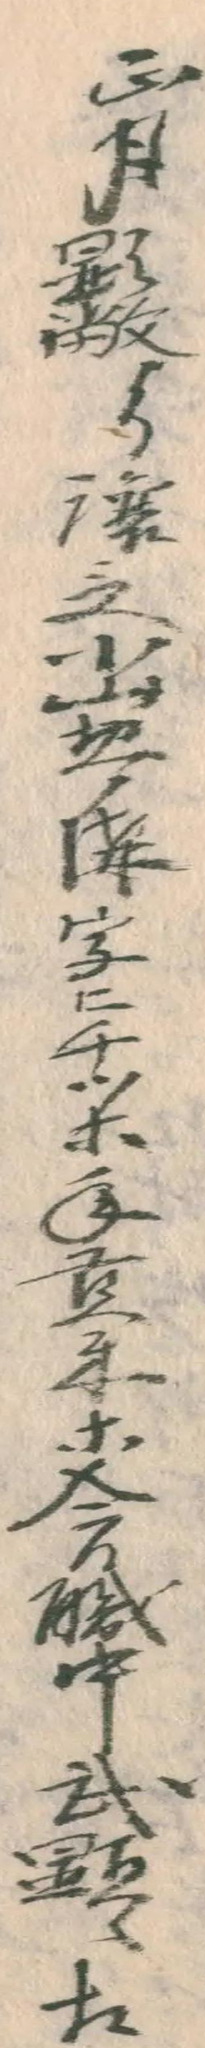正月顕敝より譲受小山惣ノ溝字ヒチツホ年貢米等今職中武顕ヘ相
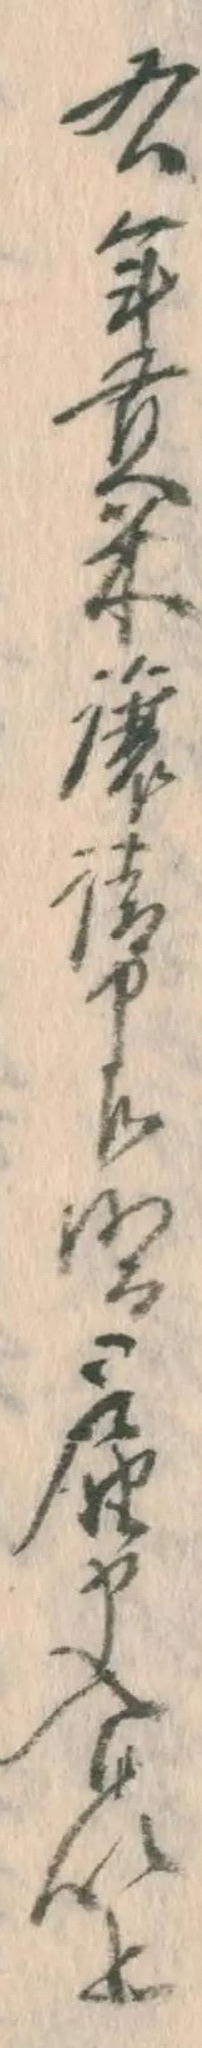右年貢米譲請申候仍而届申入候以上
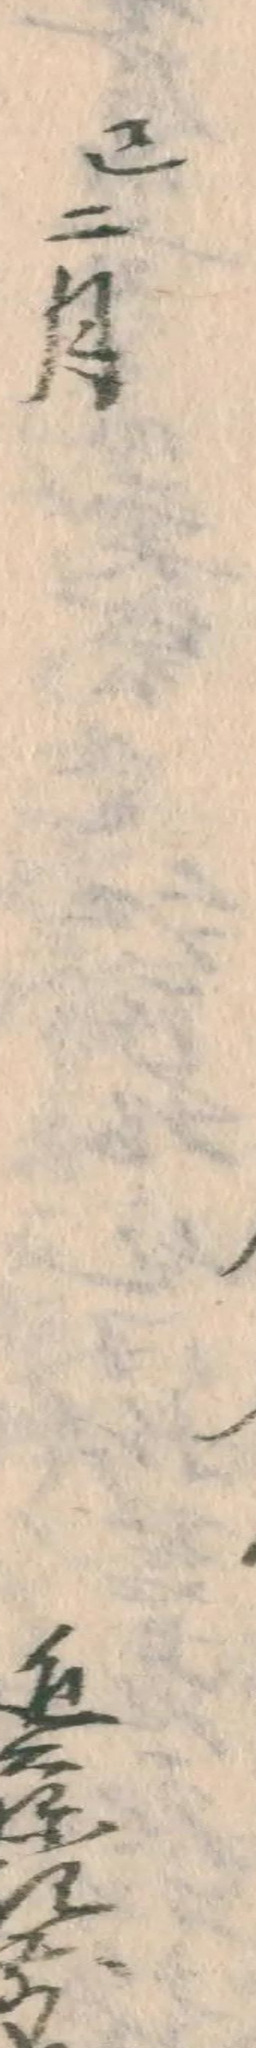巳二月近藤肥前守
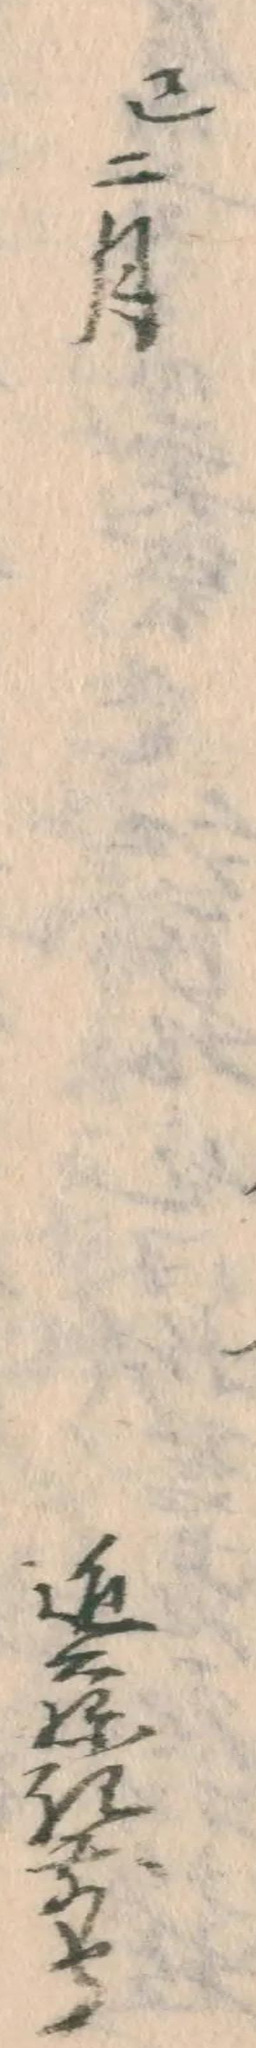巳二月近藤肥前守
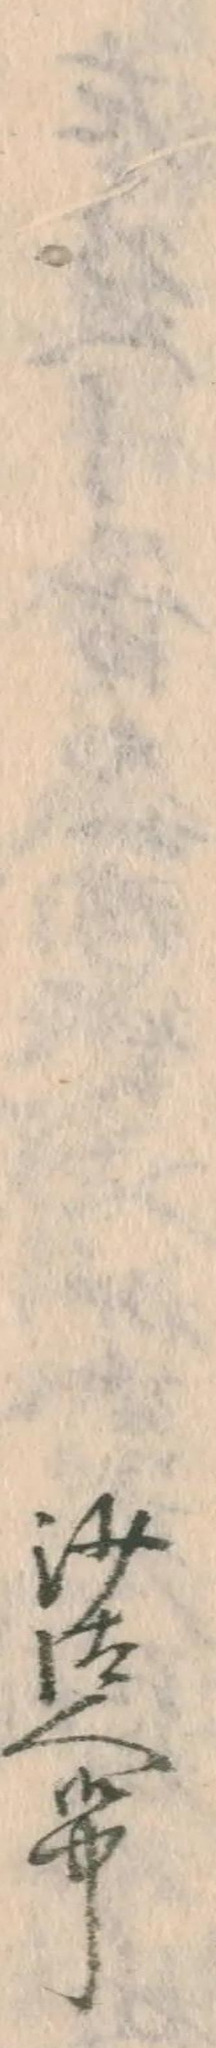沙汰人御中
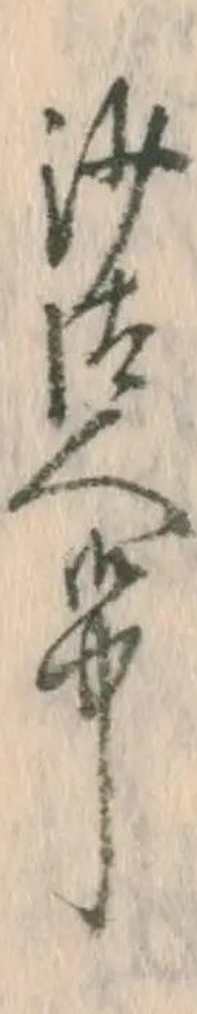沙汰人御中
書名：賀茂社記録. 第70冊
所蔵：国立国会図書館 National Diet Library, JAPAN
